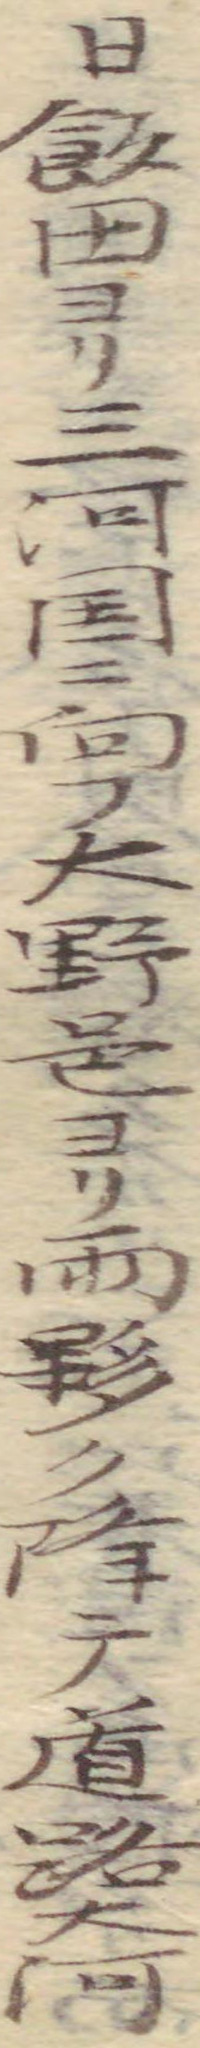日飯田ヨリ三河国ニ向フ大野邑ヨリ雨夥ク降テ道路大河
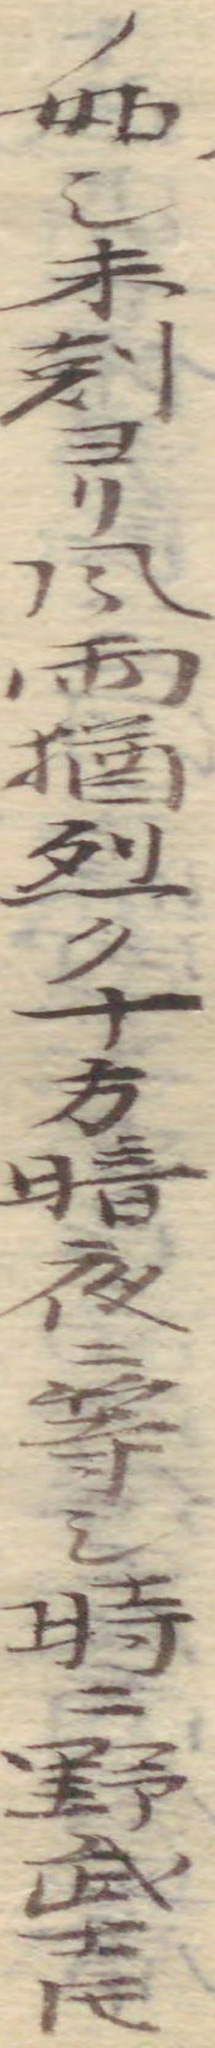ノ如シ未刻ヨリ風雨猶烈ク十方暗夜ニ等シ時ニ野武士トモ
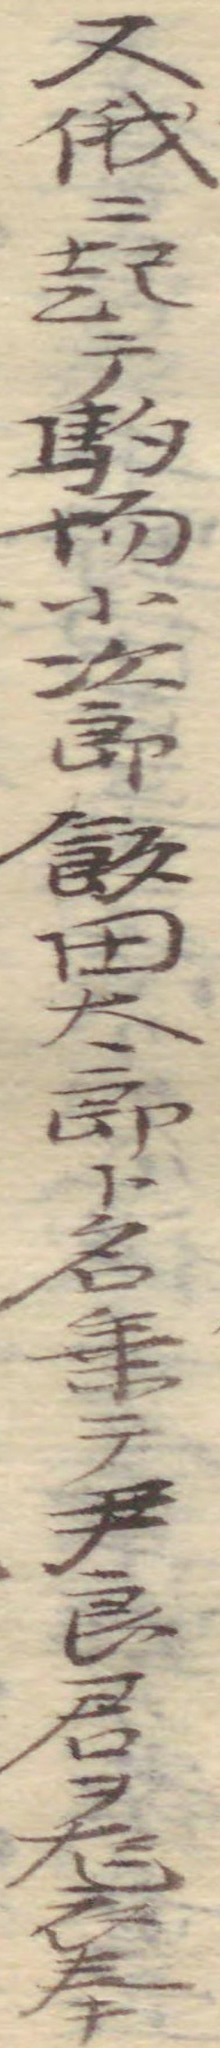又俄ニ起テ駒場小次郎飯田太郎ト名乗テ尹良君ヲ襲奉
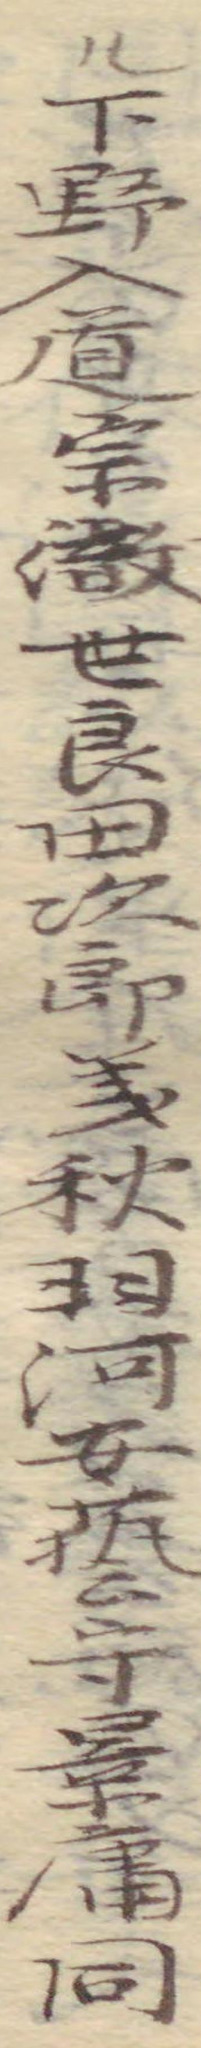ル下野入道宗徹世良田次郎義秋羽河安芸守景庸同
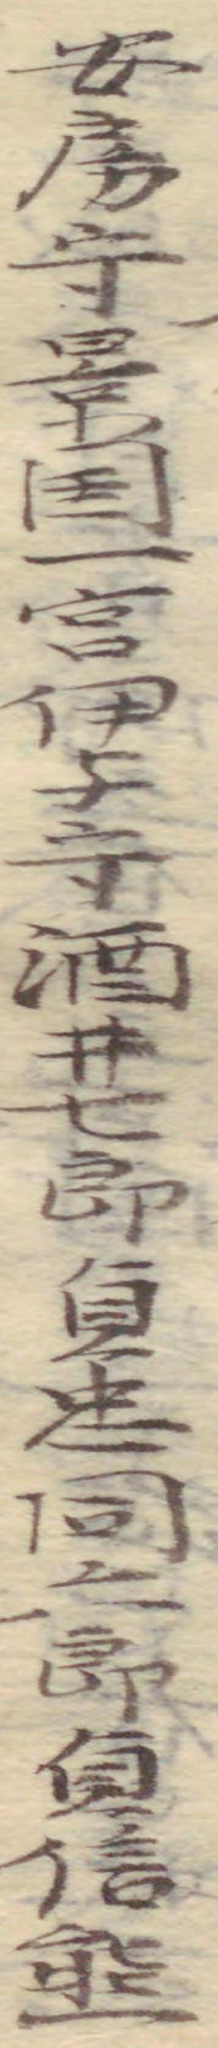安房守景国一宮伊与守酒井七郎貞忠同六郎貞信熊
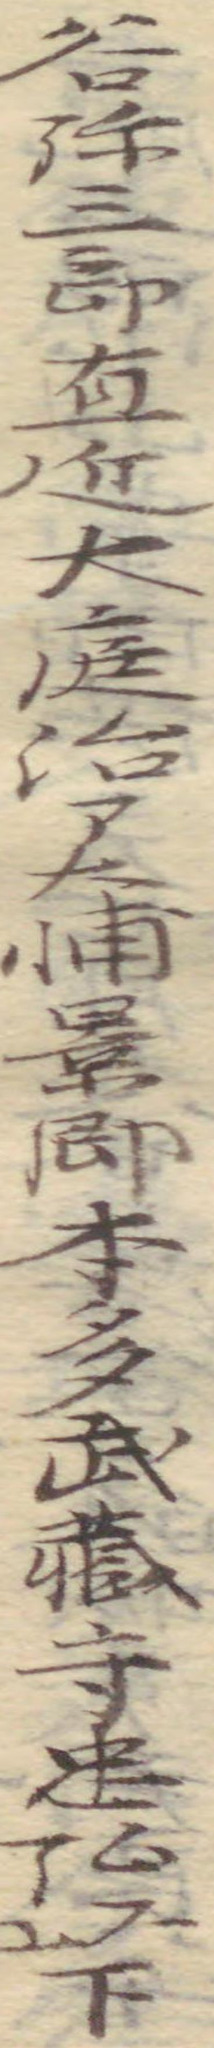谷弥三郎直近大庭治部大輔景景郷本多武蔵守忠弘以下
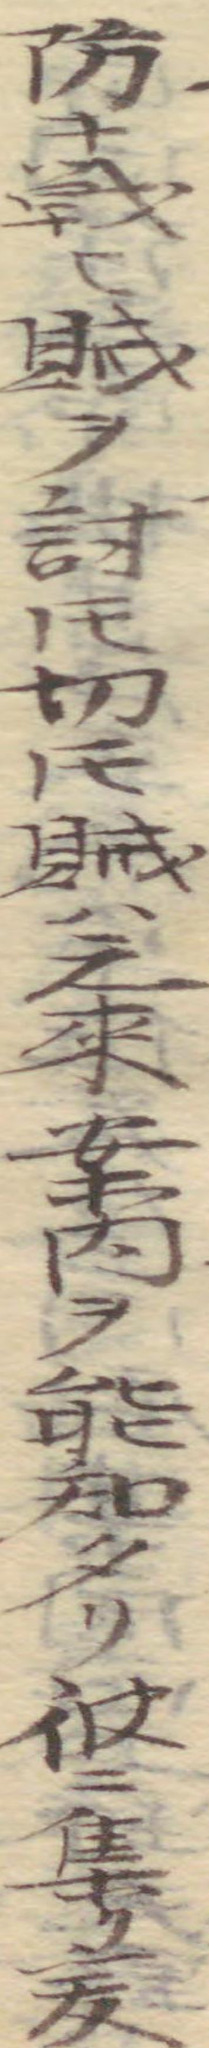防キ戦ヒ賊ヲ討トモ切トモ賊ハ元来案内ヲ能知タリ彼ニ集リ爰
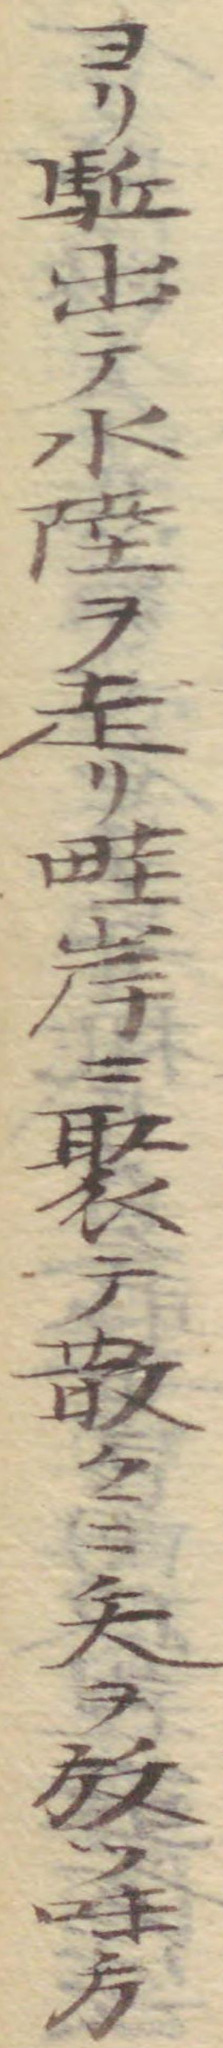ヨリ駈出テ水陸ヲ走リ畦岸ニ聚テ散々ニ矢ヲ放ツ味方
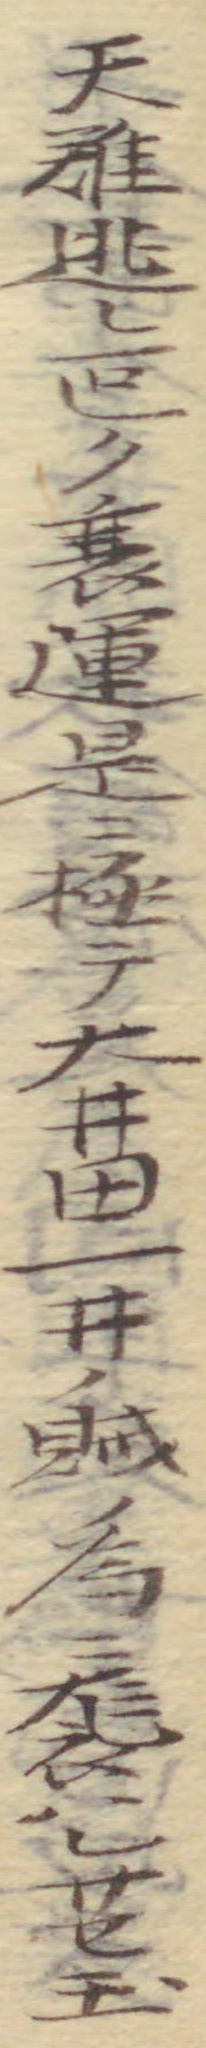天難逃レ難ク襄運是ニ極テ大井田一井ノ賊ノ為ニ襲ハレサセ玉
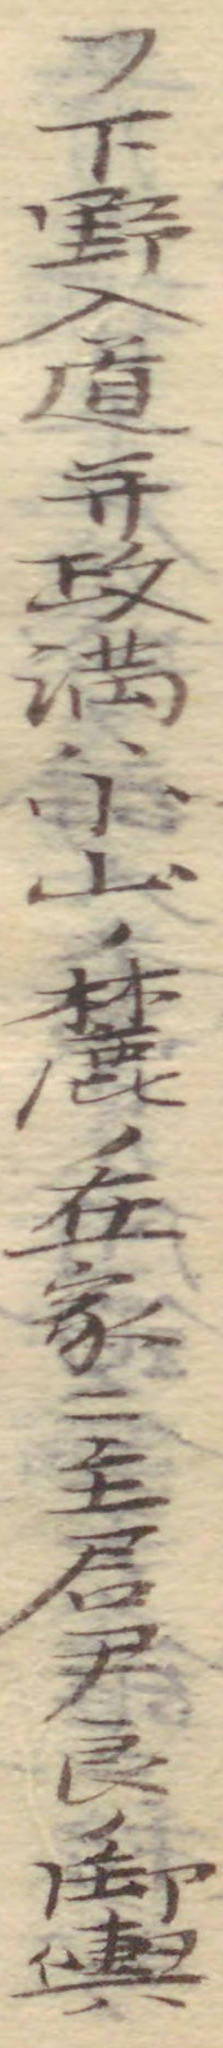フ下野入道幷政満ハ小山ノ麓ノ在家ニ主君子尹良ノ御輿
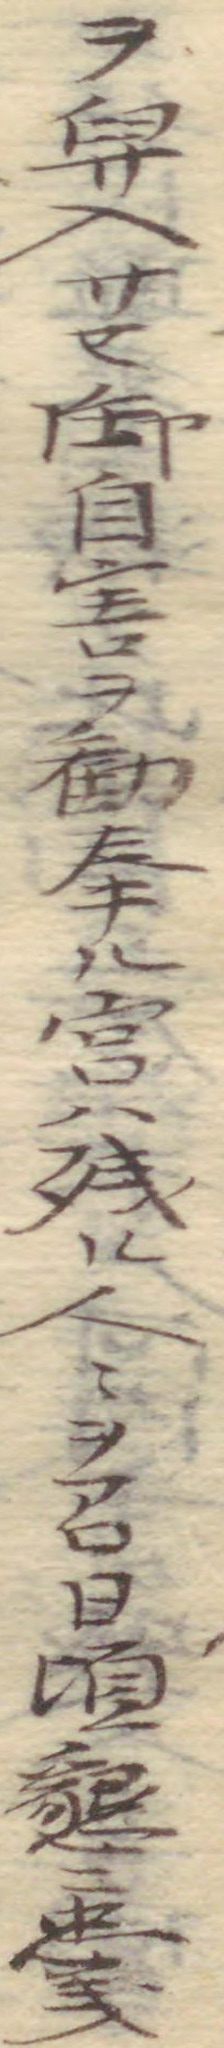ヲ舁入サセ御自害ヲ勧奉ル宮ハ残ル人々ヲ召日頃懇ニ忠義
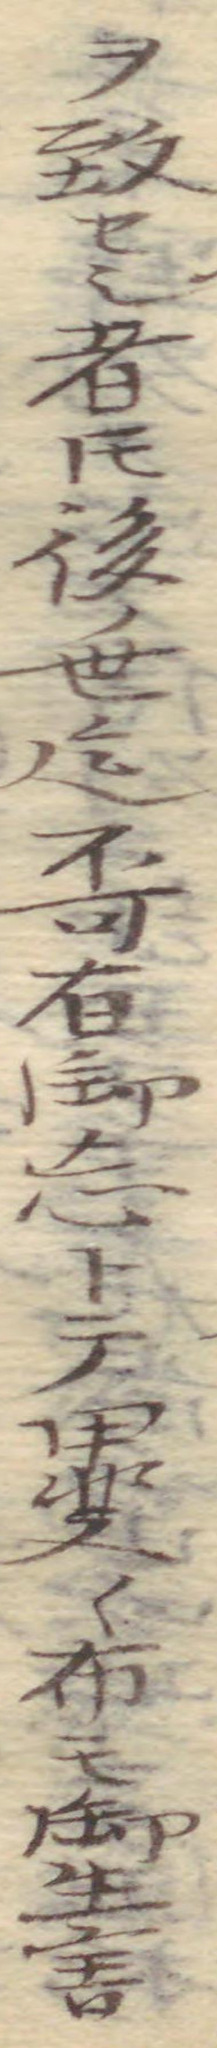ヲ致セシ者トモ後ノ世迄不可有御忘トテ甲斐〳〵布モ御生害
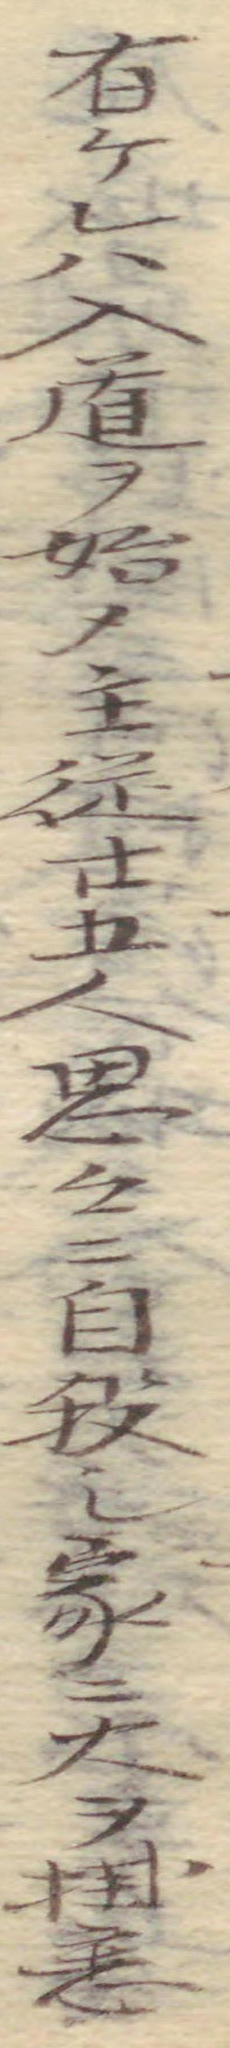有ケレハ入道ヲ始メ主従廿五人思々ニ自殺シ家ニ火ヲ掛悉
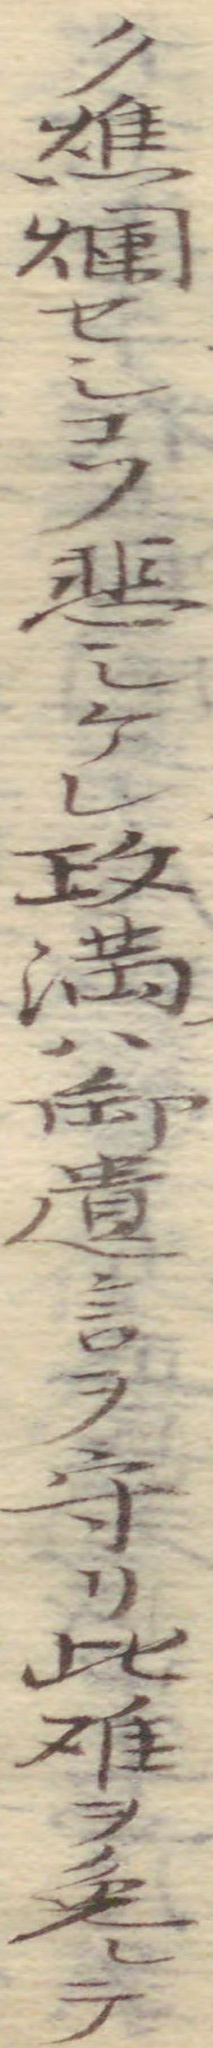ク燋爛セシコソ悲シケレ政満ハ御遺言ヲ守リ此難ヲ免レテ
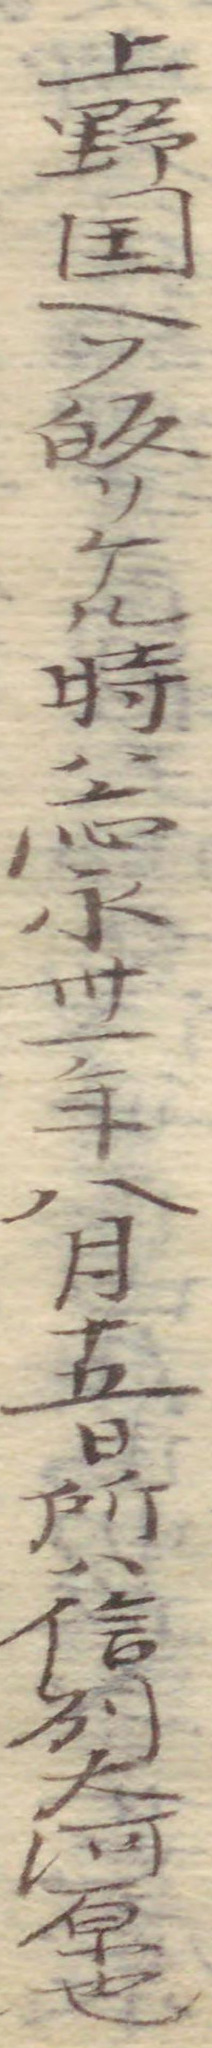上野国ヘソ帰リケル時ハ応永卅一年八月十五日所ハ信州大河原也
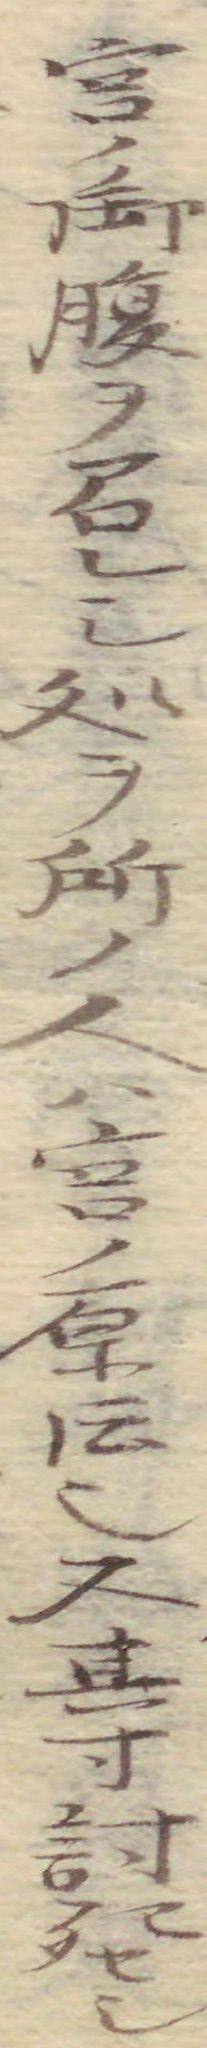宮ノ御腹ヲ召レシ処ヲ所ノ人ハ宮ノ原ト云也又其寸討死セシ
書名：鶯宿雑記. 巻199-200
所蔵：国立国会図書館 National Diet Library, JAPAN
